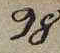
98
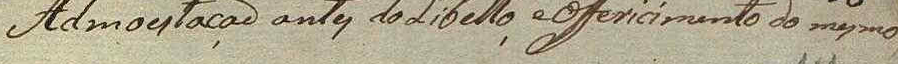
Admoestaçaõ antes do Libello, e offericimento do mesmo
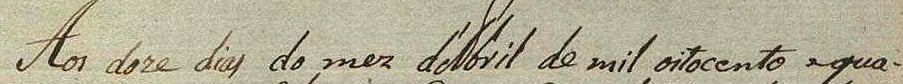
Aos doze dias do mez d'Abril de mil oitocento e qua
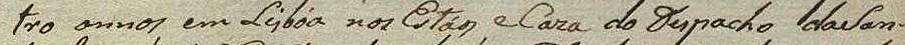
tro annos, em Lisboa nos Estáos, e Caza do Despacho da San
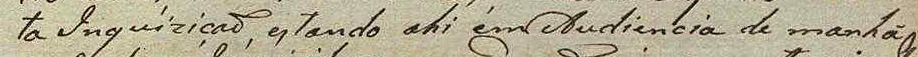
ta Inquiziçaõ, estando ahi em Audiencia de manhã
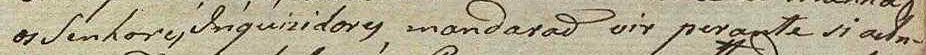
os Senhores Inquizidores, mandaraõ vir perante si a An
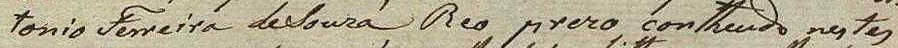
tonio Ferreira de Souza, Reo prezo contheudo nestes
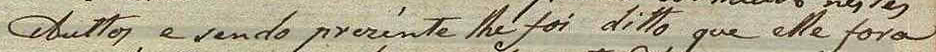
Auttos, e sendo prezente lhe foi ditto, que elle fora
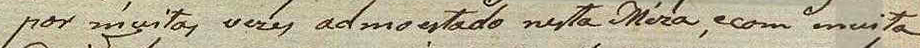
por muitas vezes admoestado nesta Meza, e com muita
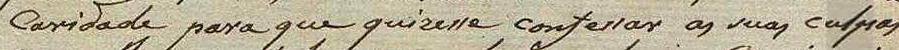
Caridade para que quizesse confessar as suas culpas
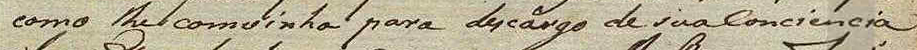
como lhe comvinha para descargo de sua conciencia,
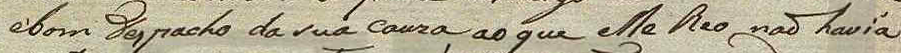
e bom Despacho da sua cauza, ao que elle Reo naõ havia
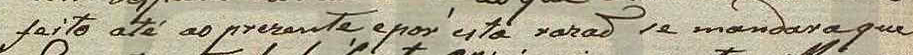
feito até ao prezente, e por esta razaõ se mandara que
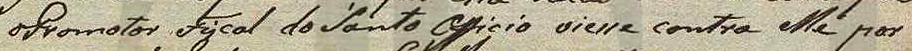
o Promotor Fiscal do Santo Officio viesse contra elle por
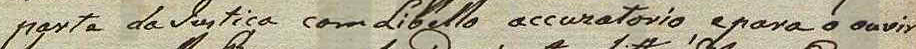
parte da Iustiça com Libello accuzatorio, e para o ouvir
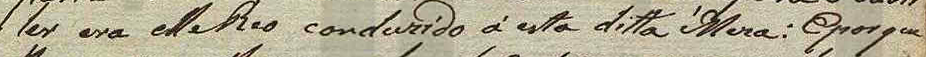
ler era elle Reo conduzido á esta ditta Meza: E porque
